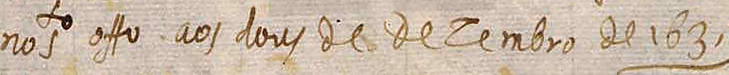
no sto offo aos dous de dezembro de 1631
